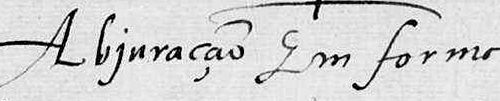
Abjuraçaõ Em forma
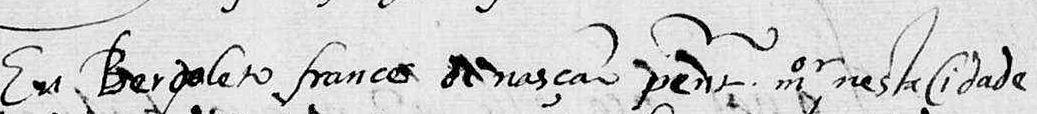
Eu Berdoleto frances de nasção pent.ro mor nesta Cidade
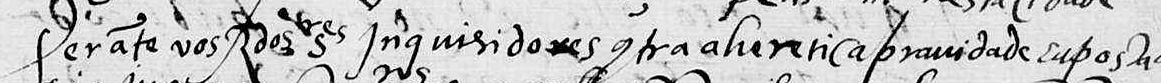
Perāte vos Rdos sres Jnquisidores ꝯtra a heretica prauidade E aposta
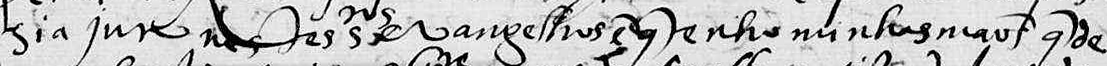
sia juro nestes stos evangelhos ē q̄ tenho minhas maõs q̄ de
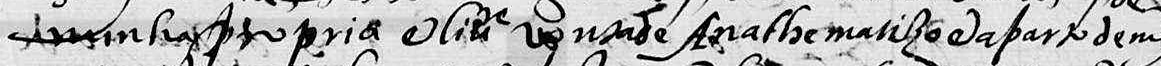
minha propria e liure vontade Anathematizo e aparto de mȳ
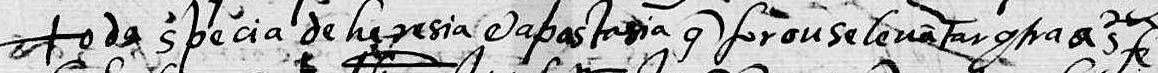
toda specia de heresia e apostasia q̄ for ou se leuātar ꝯtra a sta fe
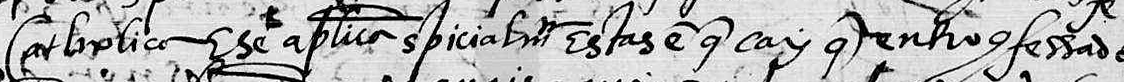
Catholica E se aplica spicialmte Estas ē q̄ cay q̄ tenho ꝯfessado
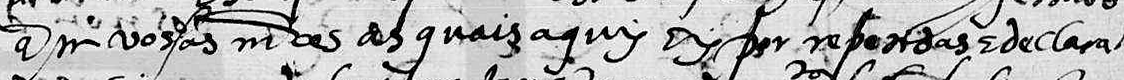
Em vossas m̄ces as quais aquy Ey por repetidas E declara
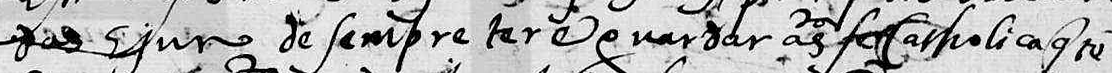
das E juro de sempre ter e guardar a sta fe Catholica q̄ tē
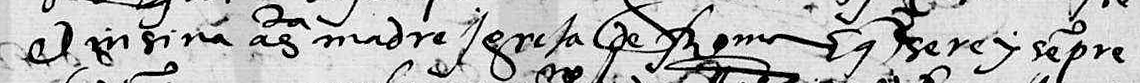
e insina a sta madre Jgreja de Roma E q̄ serey sēpre
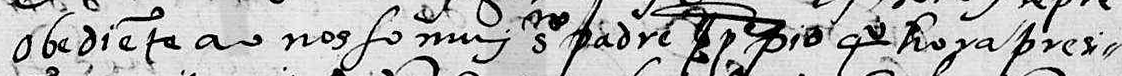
obediēte ao nosso muy sto padre p̄p̄ pio q̄ hora presi
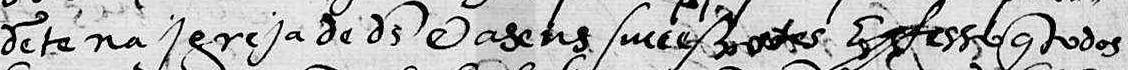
dēte na Jgreja de ds̄ e a seus successores E ꝯfesso q̄ todos
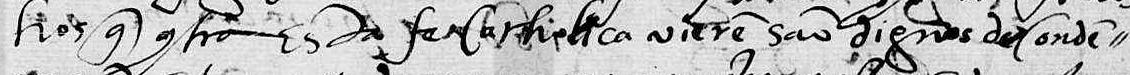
hos q̄ ꝯtra Esta fee Catholica vierē saõ dignos de Condē
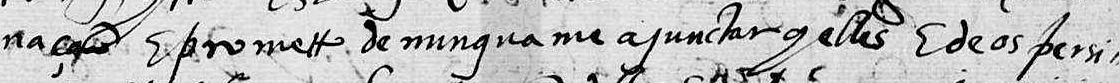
naçaõ E prometto de nunqua me ajunctar ꝯ elles E de os persi
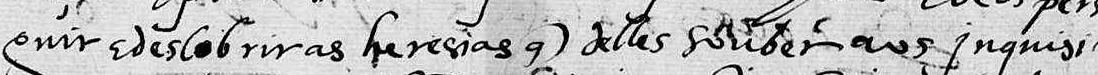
guir E descobrir as heresias q̄ delles souber aos jnquisi
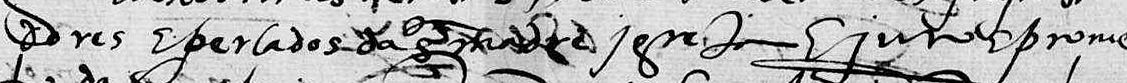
dores E perlados da sta madre jgreja E juro E promet
